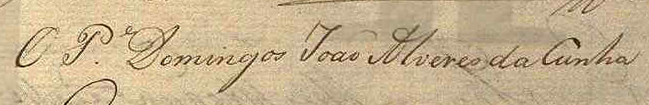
O P.e Domingos Ioaõ Alveres da Cunha
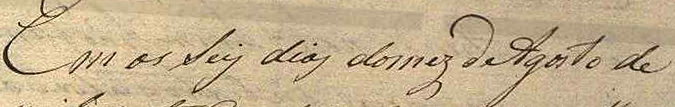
Em os seis dias do mez de Agosto de
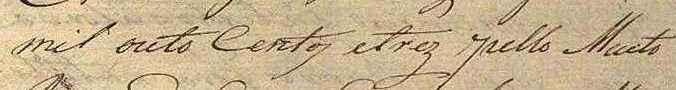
mil outoCentos e trez pello Muito
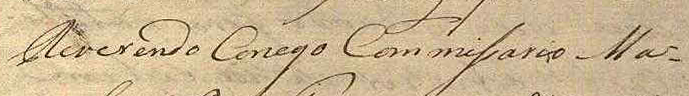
Reverendo Conego Commissario Ma
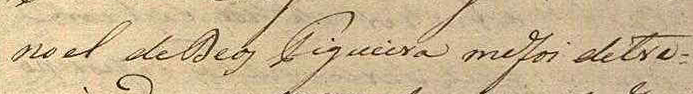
noel de Deos Figueira me foi detre
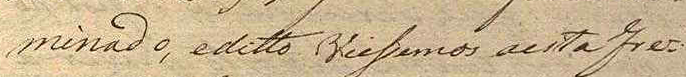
minado, e ditto Viesemos a esta fre
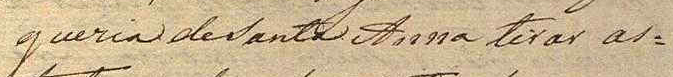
guezia de Santa Anna tirar as
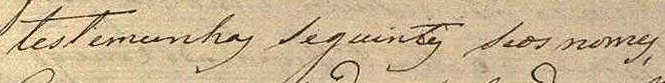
testemunhas seguintes seos nomes,
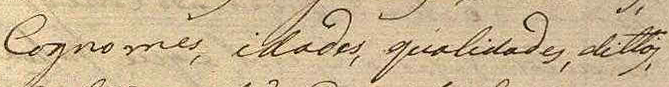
Cognomes, idades, qualidades, dittos,
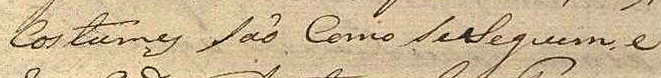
Costumes saõ Como se Seguem, e
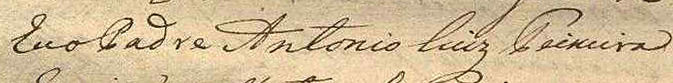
Eu o Padre Antonio luiz Teixeira
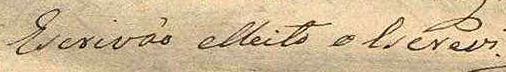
Escrivaõ elleito o Escrevi
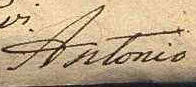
Antonio
